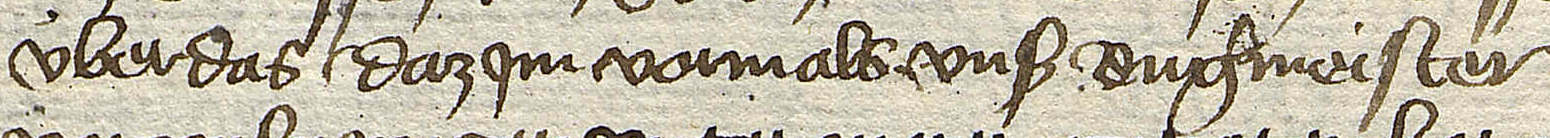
v̈ber das / daʒ Im vormals vnſ* Burg*meiſter
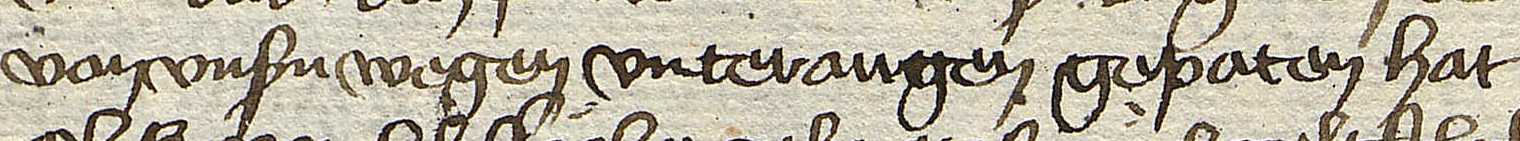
von vnſ*n wegen vnteraugen gepoten hat
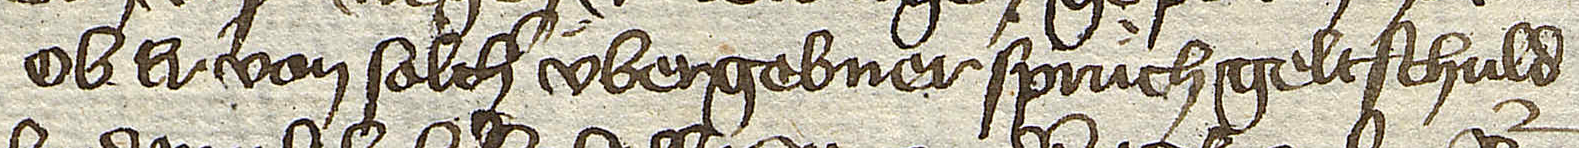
Ob Er von ſolch* v̈bergebner ſprüch geltſchuld
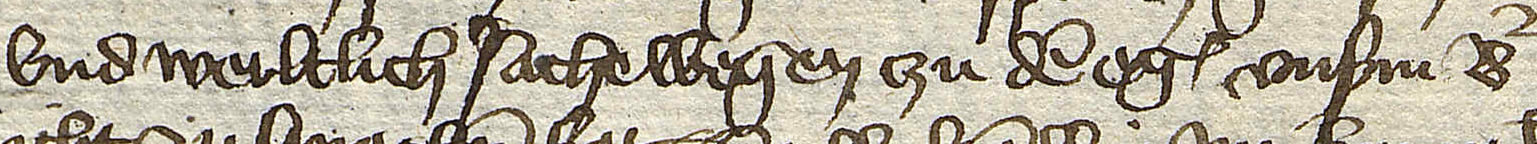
vnd werltlich* ſache wegen cʒu d* eg* vnſ*m B*
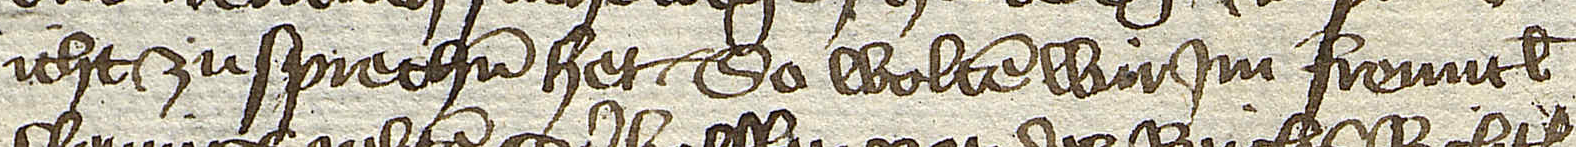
icht cʒuſprechn* het / So wolte* wir Im freuntl*
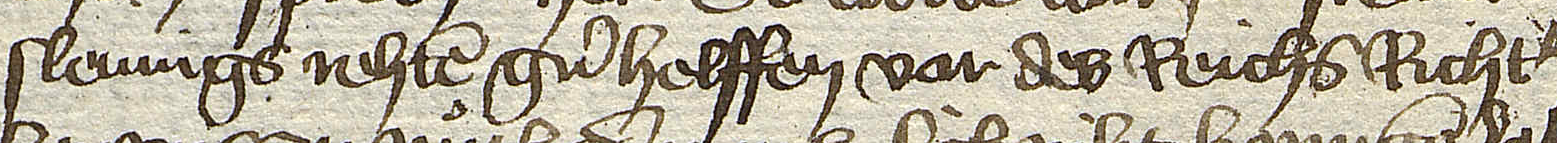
ſleunigs rehte* gn* helffen vor des Reichs Richt*
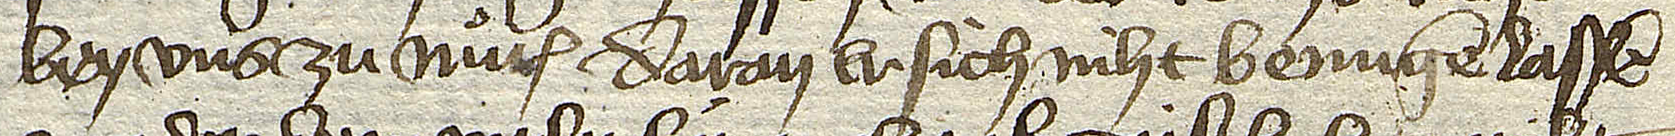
bey vns cʒu Nür* / Daran Er ſich nicht benuge* laſſe*
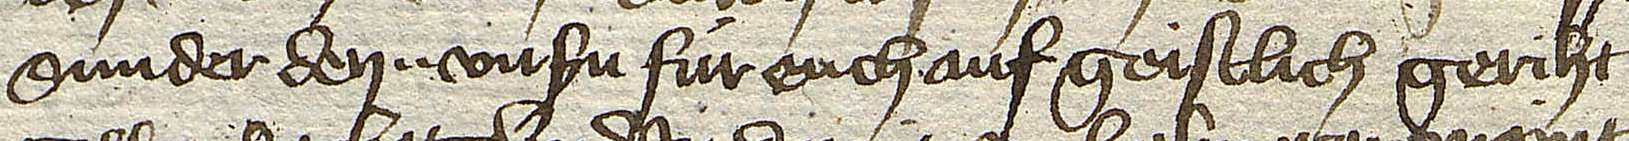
Sunder den ~ vnſ*n für euch auf geiſtlich geriht
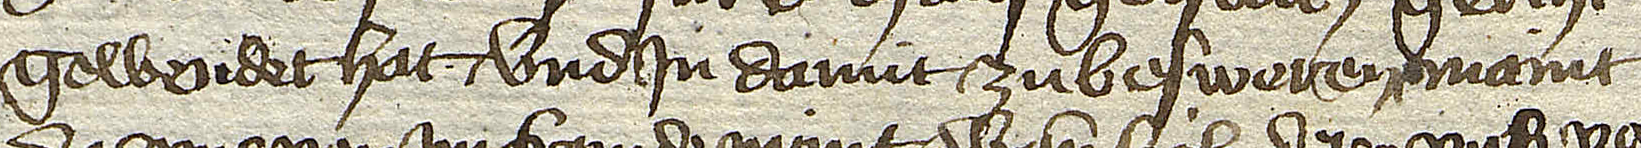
gewendet hat / vnd In damit cʒubeſweren maint
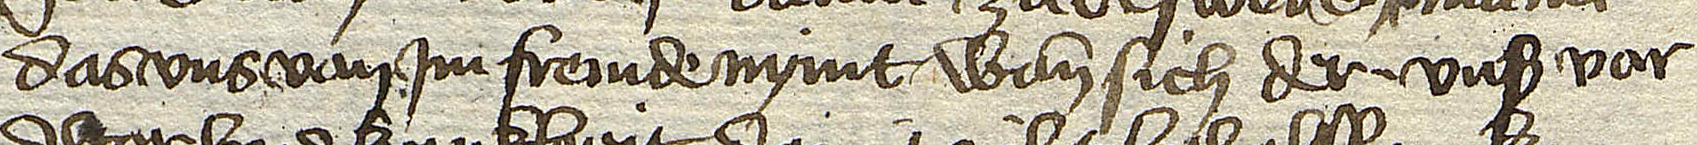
das vns von Im fremde nymt / wan* ſich der ~ vnſ* vor
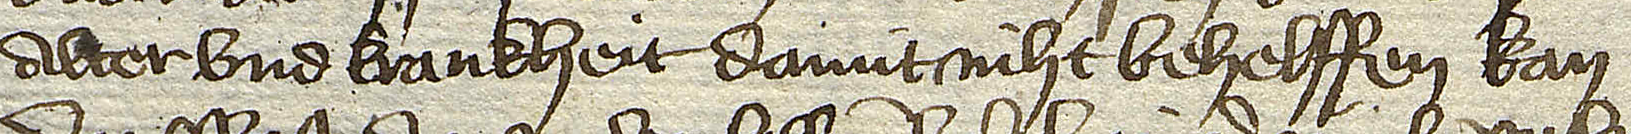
Alter vnd krankheit damit niht behelffen kan
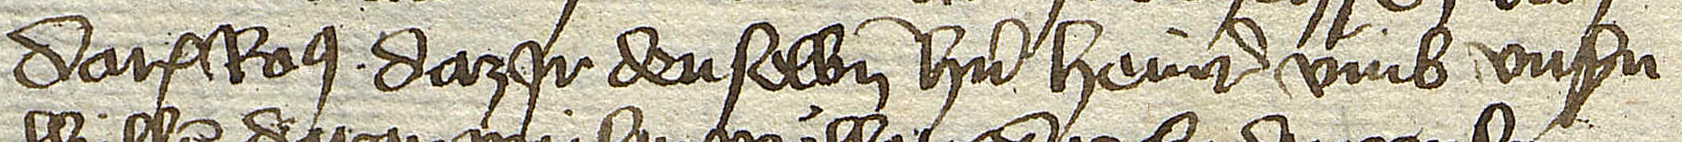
Dar* Ro* . daʒ Ir denſelbn* hn* heinr* v̈mb vnſ*n
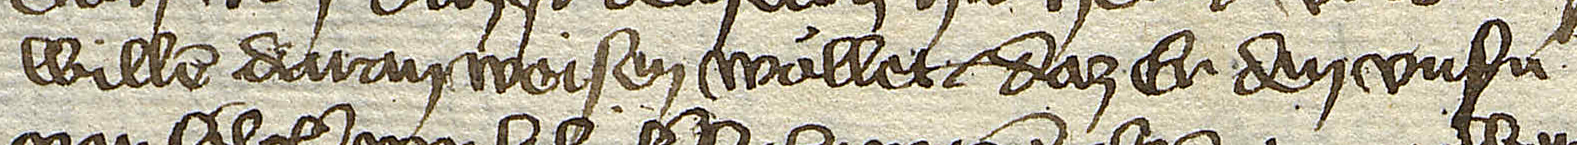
wille* daran weiſen wöllet / daʒ Er den vnſ*n
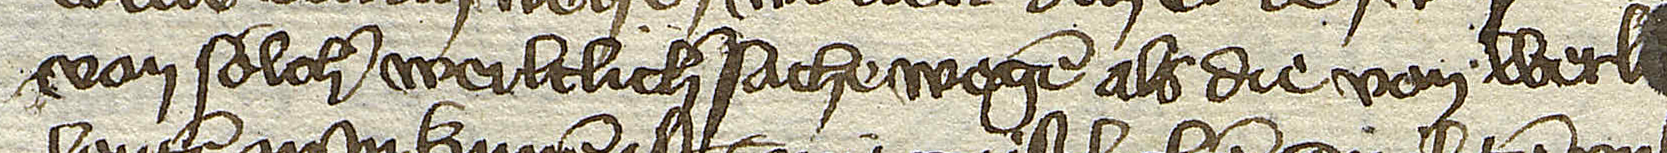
von ſölch* werltlich* ſache wege* als die von werl%%
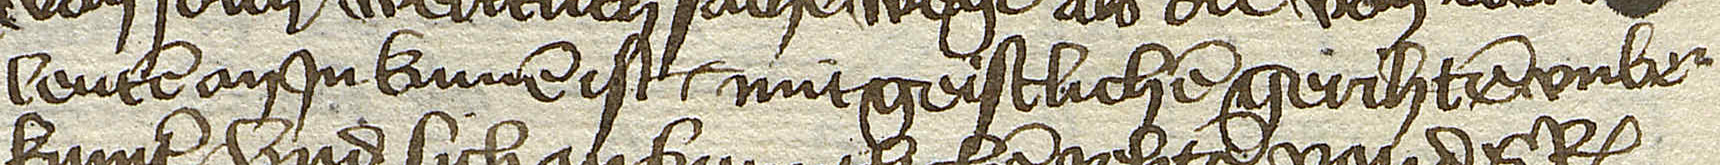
leute* an In kume* iſt / mit geiſtliche* gerihte* vnbe -
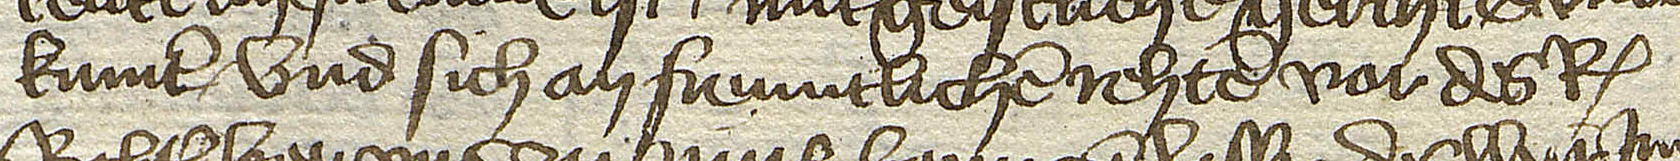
kumt* / vnd ſich an freuntliche* rehte* vor des R*
